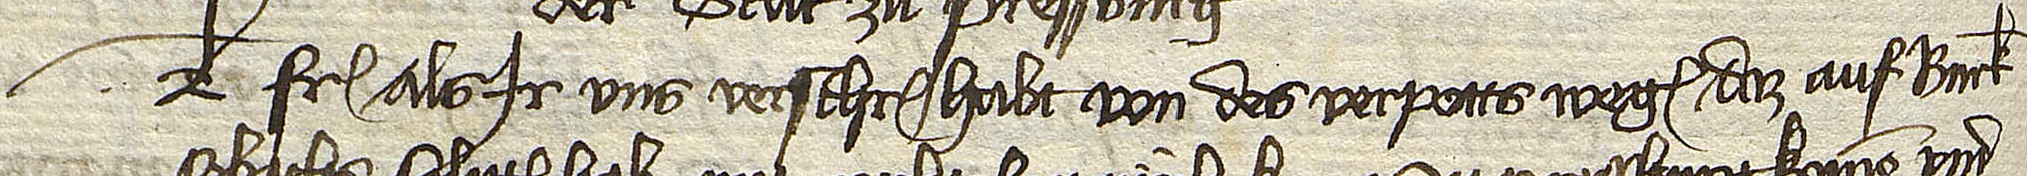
L* fr* / als Ir vns verſchr* habt von des verpotts weg* / daʒ auf Burk*
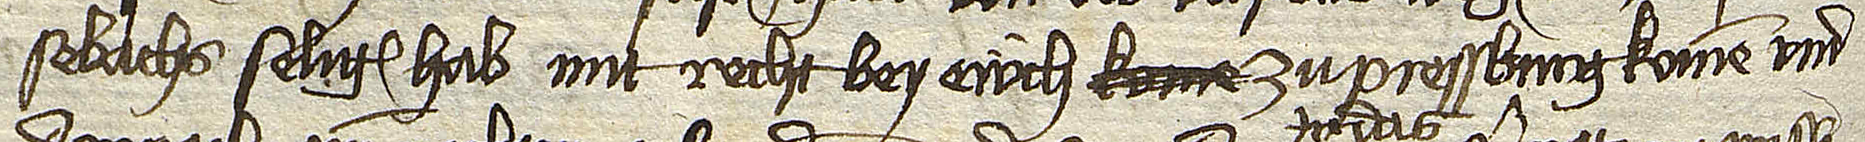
ſebachs ſelig* hab mit recht bey ewch kome ʒu Preſſburg kome* vnd
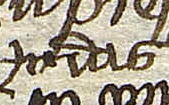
Ir das
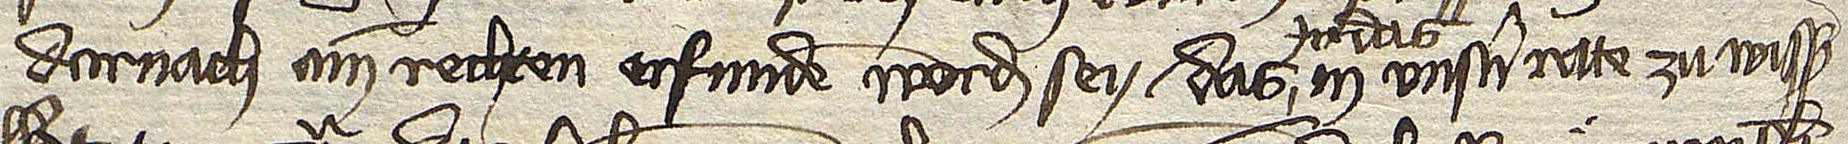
darnach ain* rechten erfunde* word* ſey / das in vnſn* rate ʒu wiſſ*
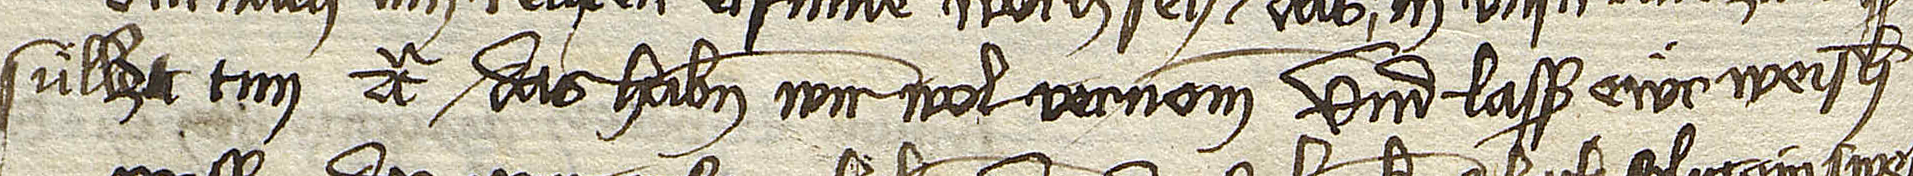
ſüllet tun ec* / das habn* wir wol vernom* Vnd laſſ* ewr weiſh*
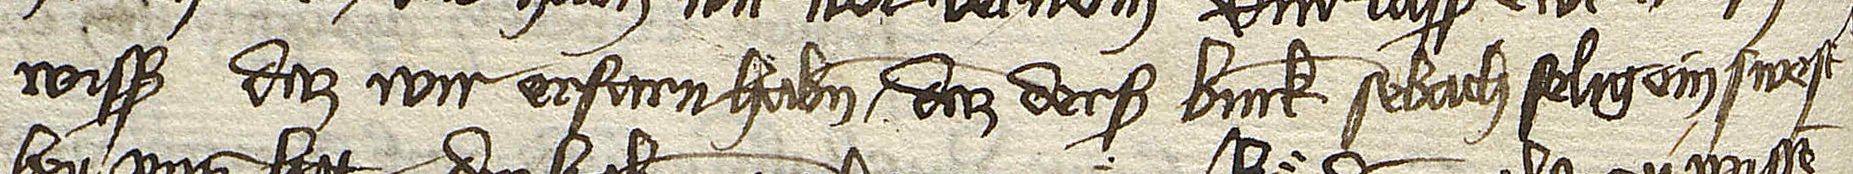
wiſſ* daʒ wir erfarn habn* / daʒ derſ* burk* ſebach ſelig ein ſweſt*
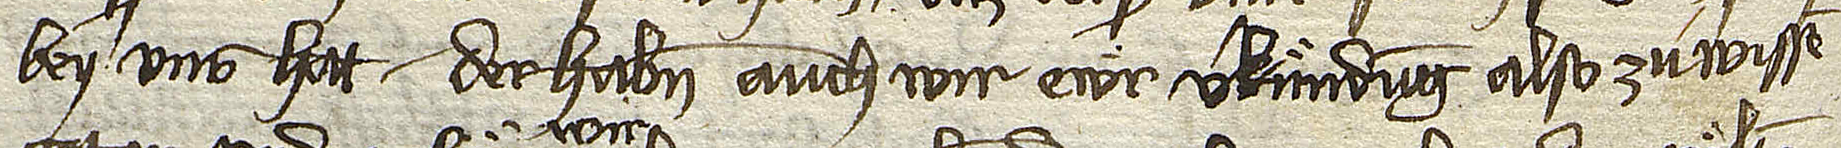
bey vns hat / der habn* auch wir ewr v*kündug* alſo ʒu wiſſe*
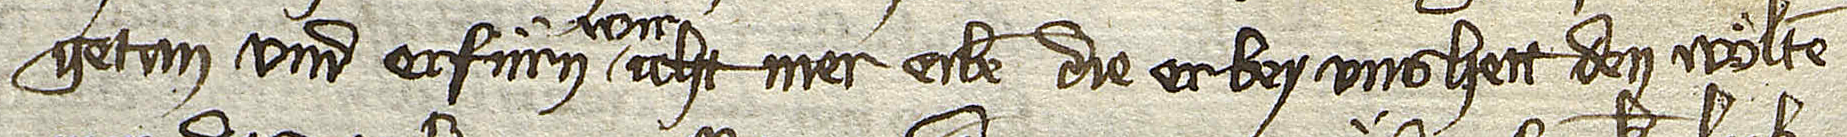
getan vnd erfürn / icht mer erbe* die er bey vns hett den wölte*
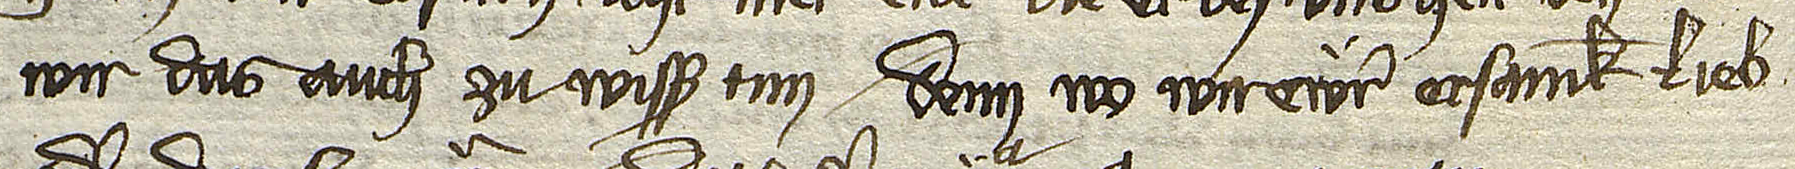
wir das auch ʒu wiſſ* tun / Denn wo wir ewr* erſamk* lieb
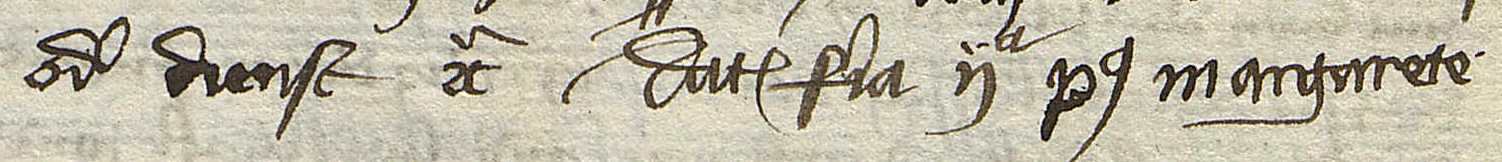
od* dienſt ec* / Dat* fi*a ii* p* margarete
